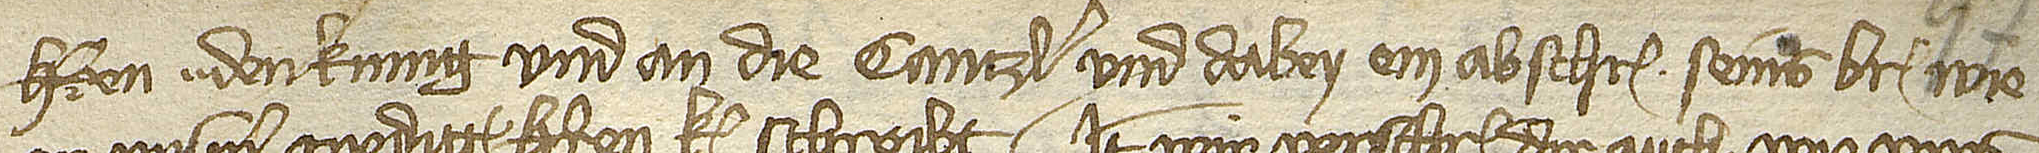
h*ren ~ den kunig vnd an die Cancʒl* vnd dabey ein abſchr* . ſeins br* wie
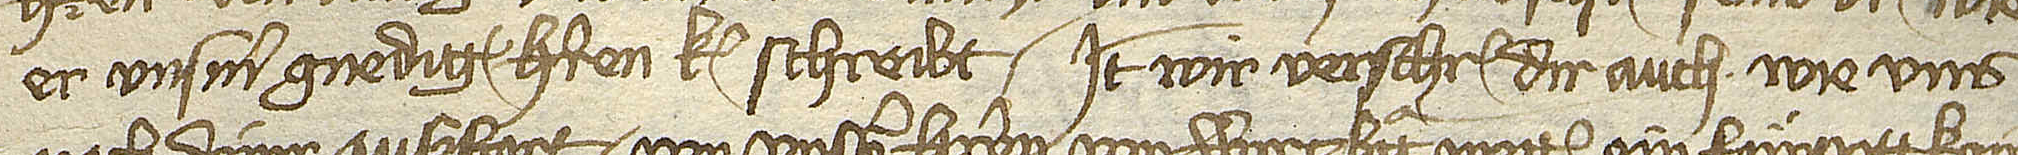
er vnſm* gnedig* h*ren k* ſchreibt / It* wir verſchr* dir auch . wie vns
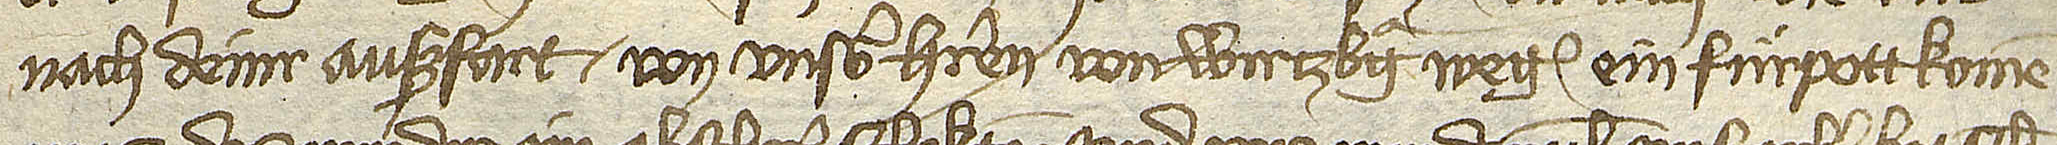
nach deinr auſʒfart / von vnſs* h*ren von wircʒb*g weg* ein fürpott kome*
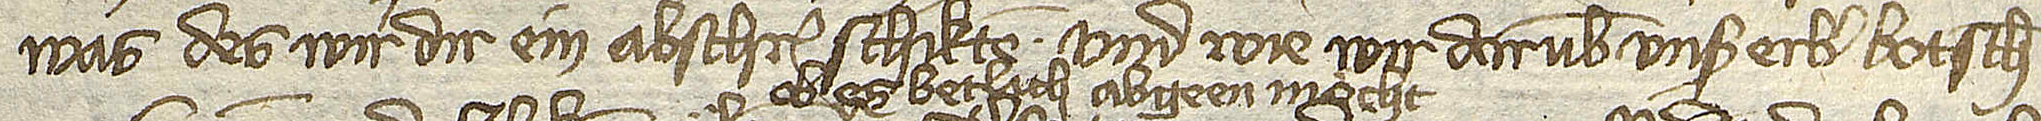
was des wir dir ein abſchr* ſchikte* . vnd wie wir darub* vnſ* erb* botſch*
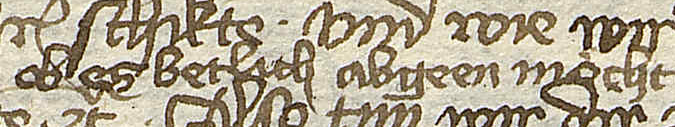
ob es betlich abgeen möcht
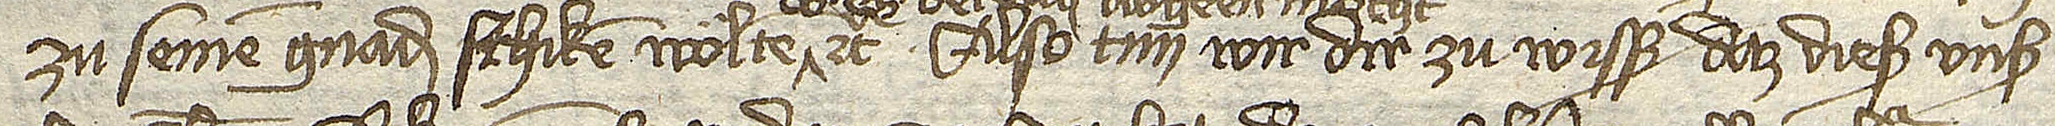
ʒu ſeine* gnad* ſchike* wölte* ec* . Alſo tun wir dir ʒu wiſſ* daʒ dieſ* vnſ*
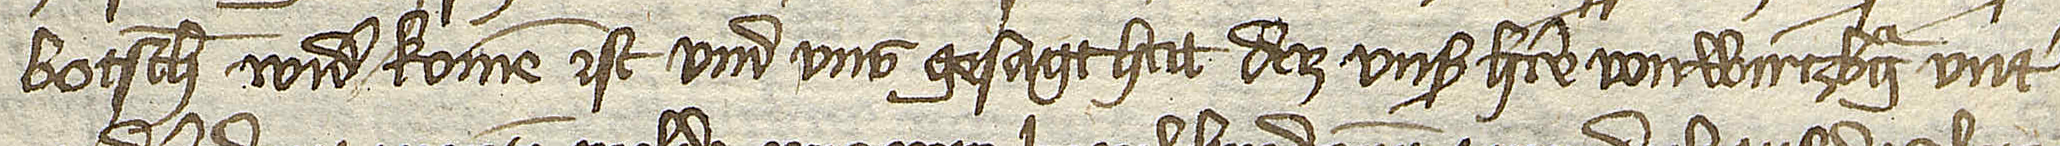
botſch* wid* kome* iſt vnd vns geſagt hat daʒ vnſ* h*re von wircʒb*g vnt*
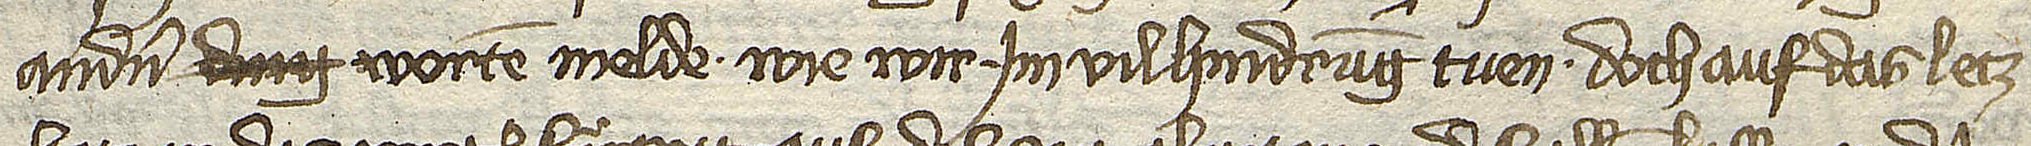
andn* ding worte* melde . wie wir Im vil hindru*g tuen . Doch auf das lecʒ
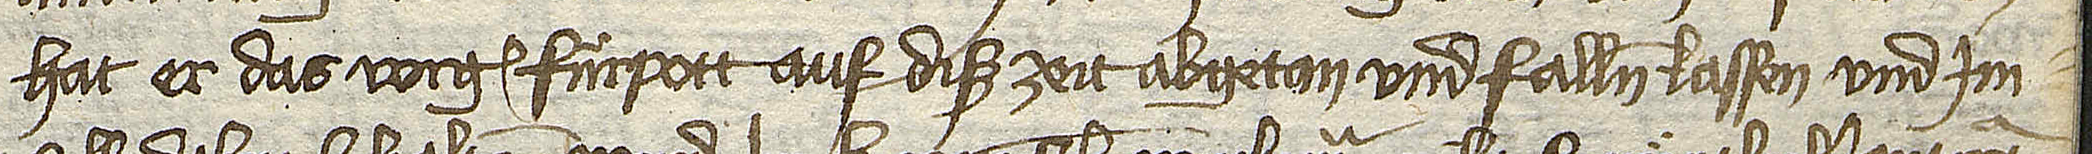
hat er das vorg* fürpott auf diſʒ ʒeit abgetan vnd falln* laſſen vnd Im =
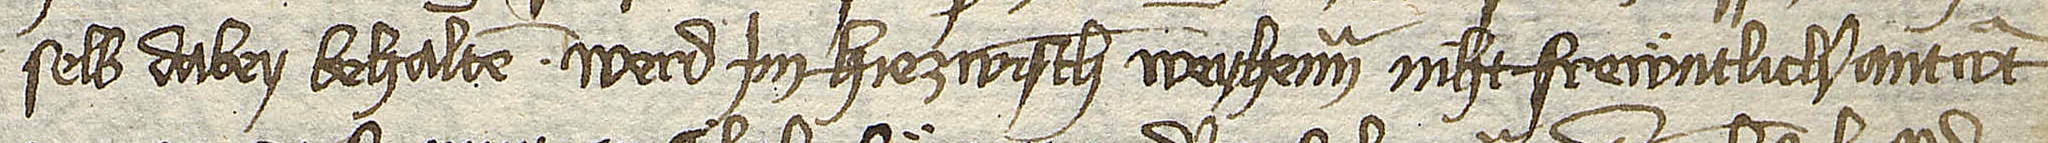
ſelb dabey behalte* . werd Im hieʒwiſch* weyheim* niht freẅntlich* antw*t
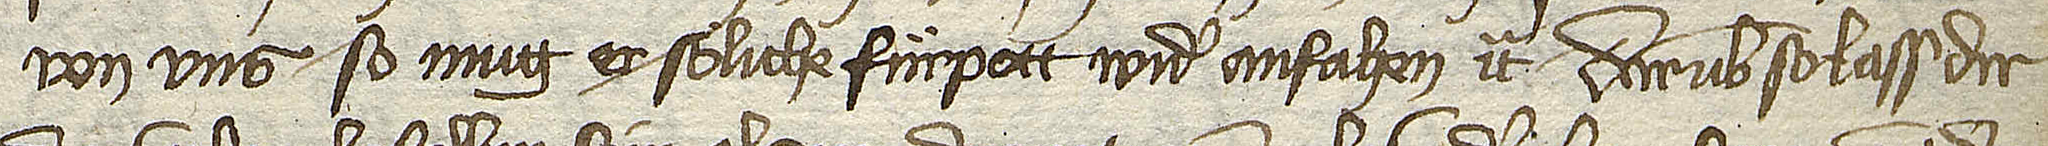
von vns / ſo mug er ſöliche fürpott wid* anfahen ec* / Darub* ſo laſſ dir
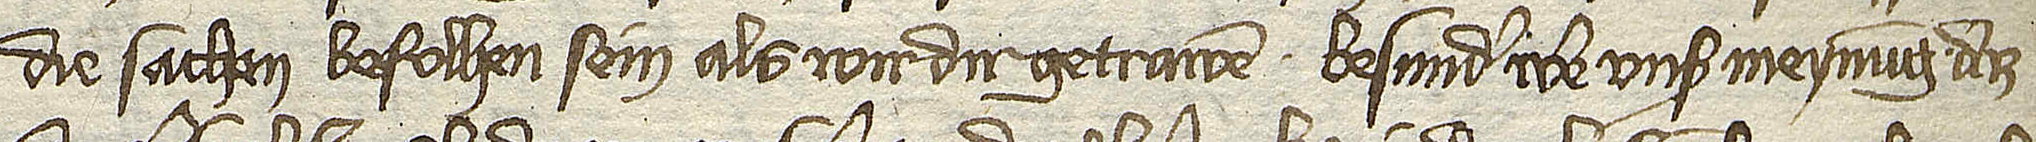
die ſachen befolhen ſein als wir dir getrawe* . beſund* w*e vnſ* meynu*g . daʒ
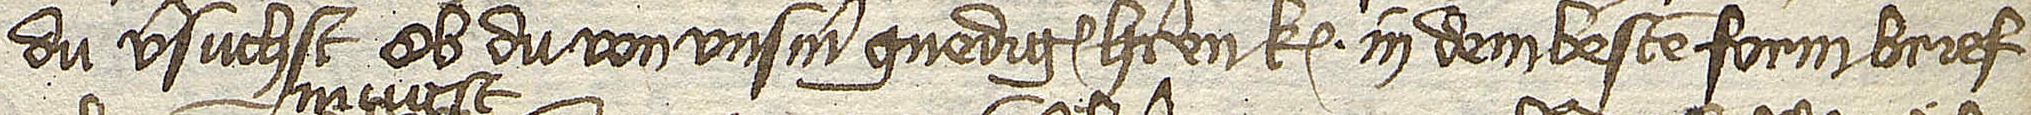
du v*ſuchſt Ob du von vnſm* gnedig* h*ren k* . in dem beſte* form brief
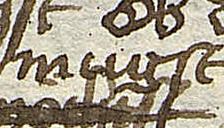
mugſt
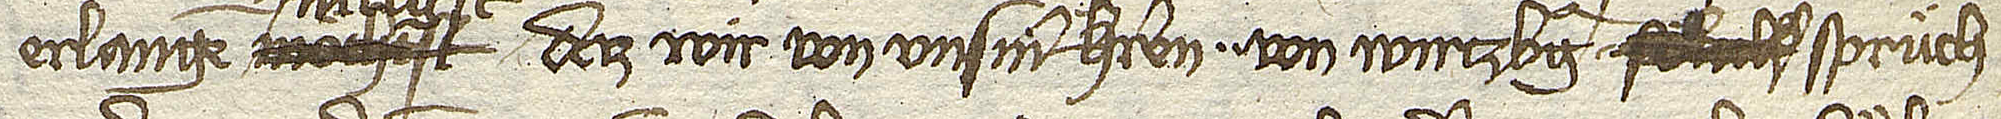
erlange* möchtſt / Daʒ wir von vnſm* h*ren ~ von wircʒb*g / ſölich* ſprüch
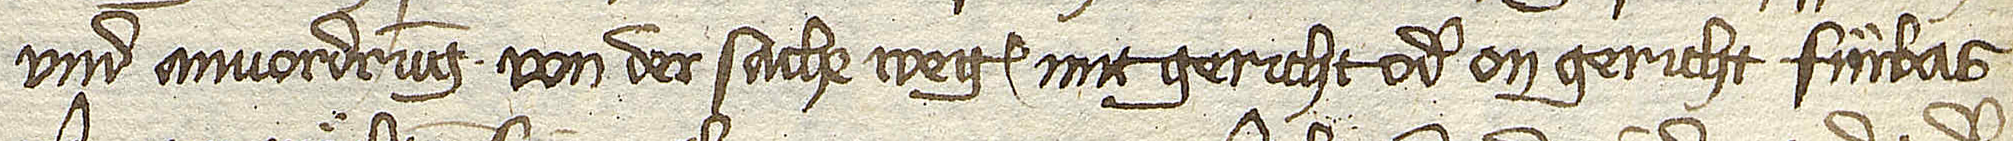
vnd anuordru*g . von der ſache weg* mit gericht od* on gericht fürbas
